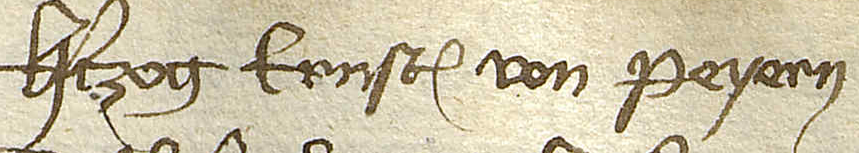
H*cʒog Ernſt* von Peyern
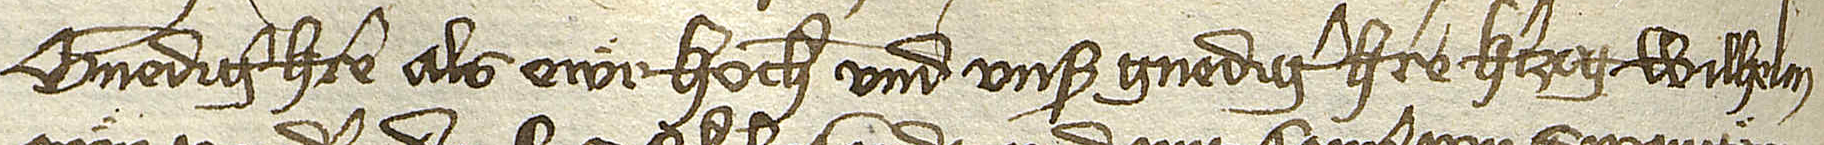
Gnedig* hre* als ewr hoch* vnd vnſ* gnedig* hre* Hcʒog* Wilhelm
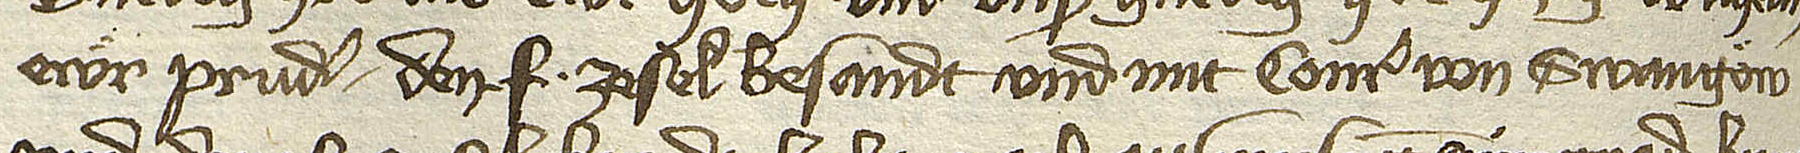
ewr prud* / den . f . ʒeſel beſandt vnd mit Conr* von Swangöw
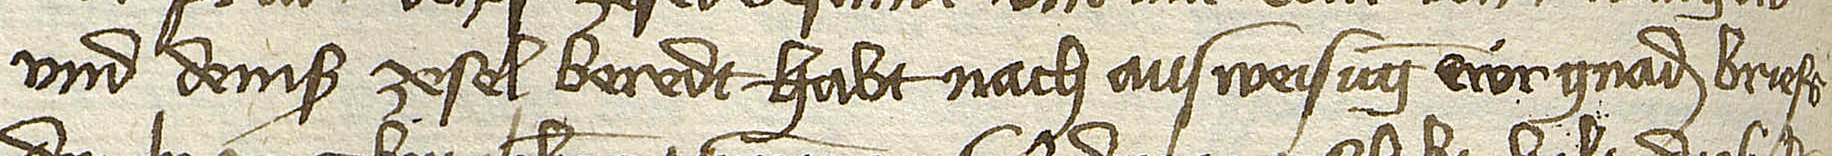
vnd demſ* ʒeſel beredt habt nach auſweiſu*g ewr gnad* briefs
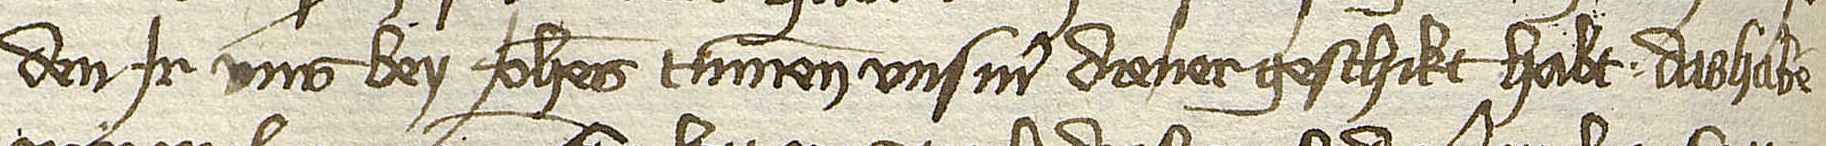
den Ir vns bey Iohes* tum*en vnſ*m diener geſchikt habt . das habe*
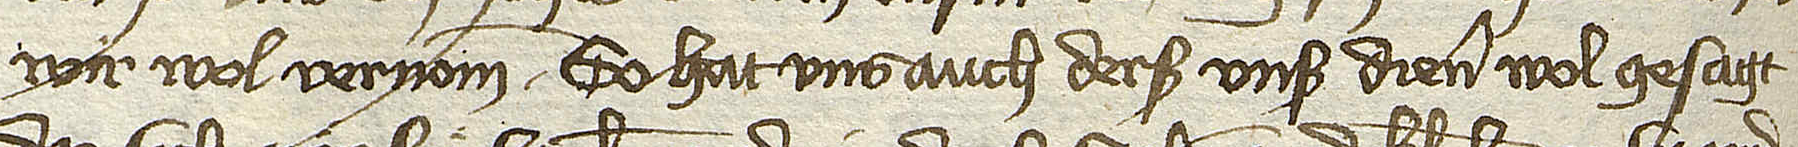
wir wol vernom* / So hat vns auch derſ* vnſ* dien* wol geſagt
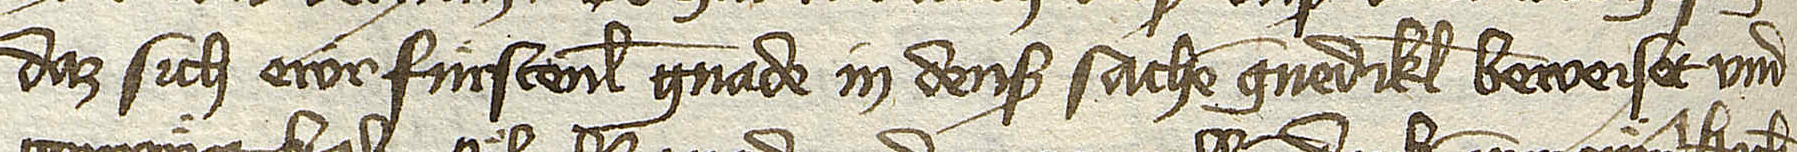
daʒ ſich ewr fürſtenl* gnade in denſ* ſache* gnedikl* beweiſet vnd
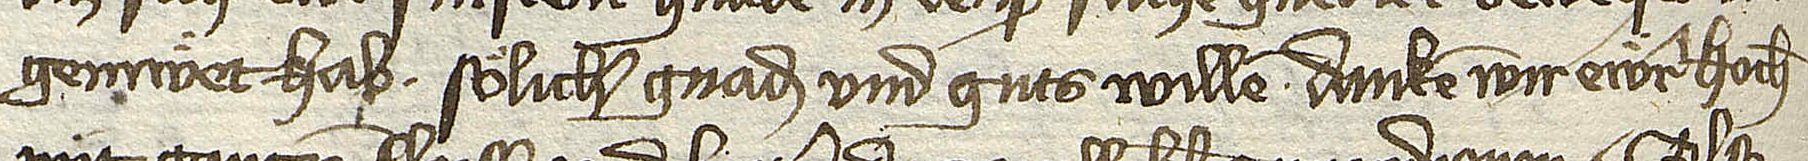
gemwet hab . ſölich* gnad* vnd guts wille* . danke* wir ewr* hoch*
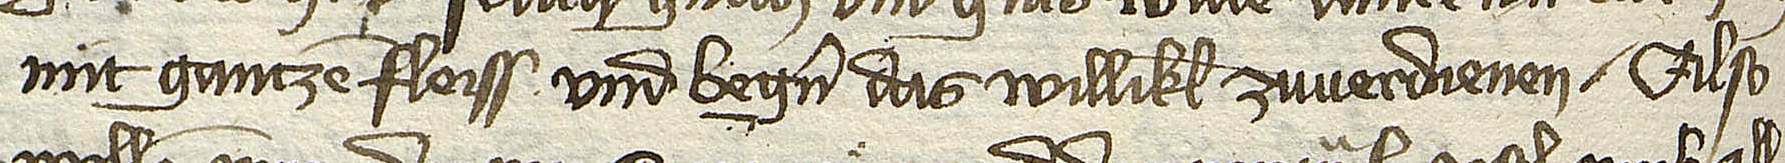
mit gancʒe* fleiſſ . vnd begn* das willikl* ʒuuerdienen / Alſo
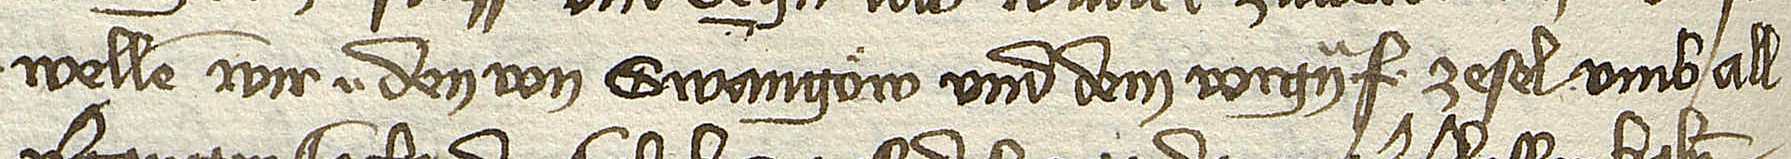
welle* wir ~ den von Swangöw vnd dem vorgn* . f . ʒeſel vmb all
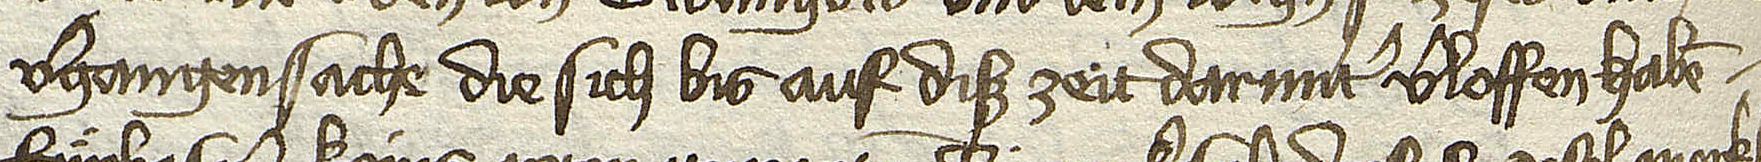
v*gangen ſache die ſich bis auf diſʒ ʒeit darmit* v*loffen habe* /
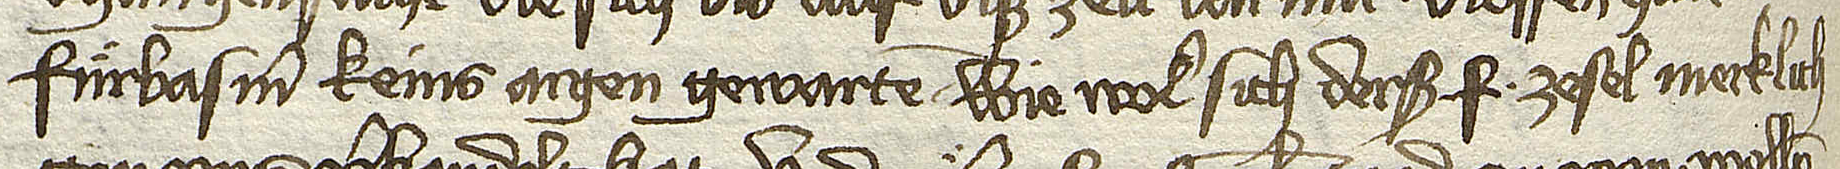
fürbaſm* keins argen gewarte* / wie wol ſich derſ* . f . ʒeſel merklich
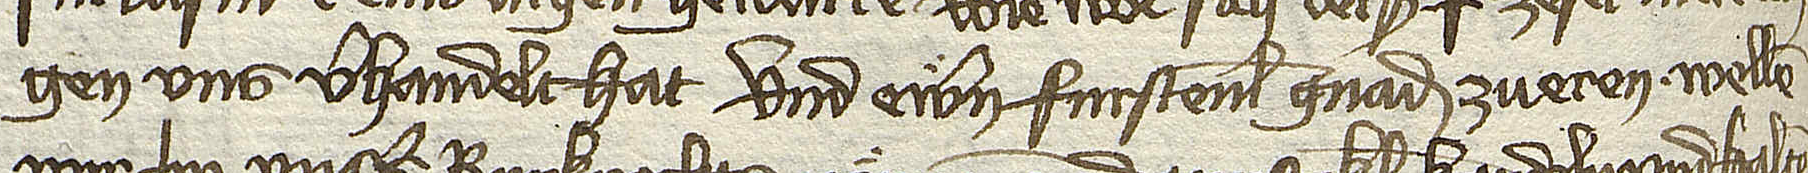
gen vns v*handelt hat Vnd ew*n furſtenl* gnad* ʒueren . welle*
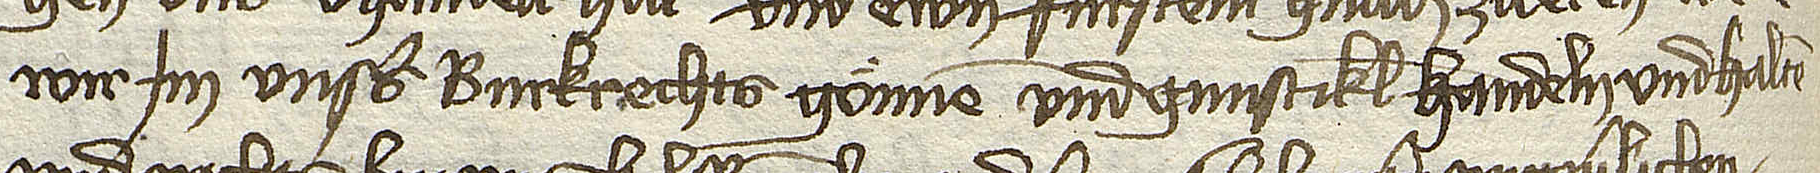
wir Im vnſ*s Burkrechts gönne* vnd gunſtikl* handeln vnd halte*
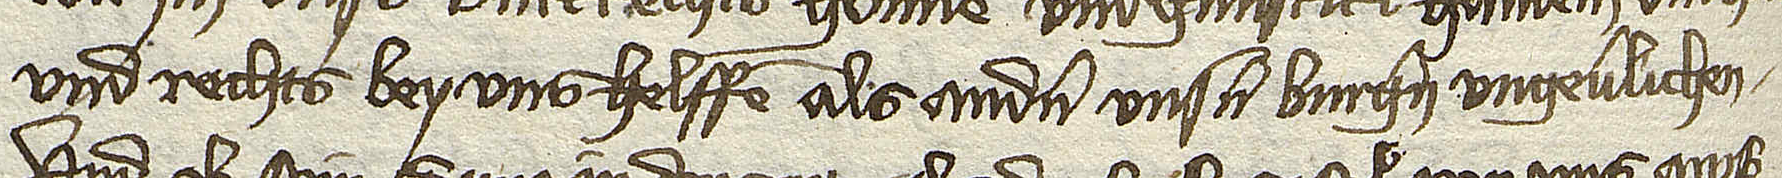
vnd rechts bey vns helffe* als and*n vnſ*n burg*n vngeu*lichen /
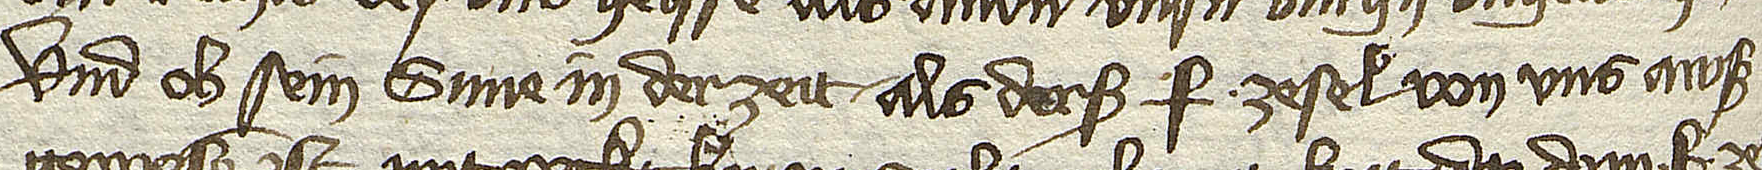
Vnd ob ſein Sune in derʒeit / als derſ* . f . ʒeſel von vns awſʒ
